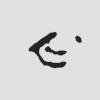日
